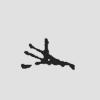出
